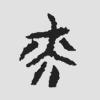光
